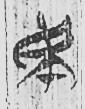民
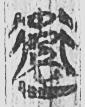{衛止}
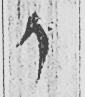人
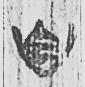自
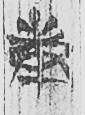庚
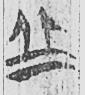丘
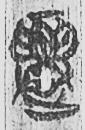{䙴止}
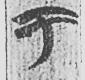于
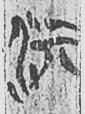{水亓}
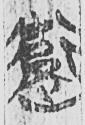{衛止}
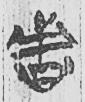周
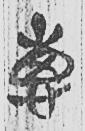惠
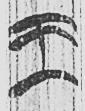王
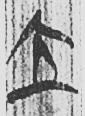立
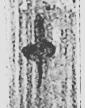十
